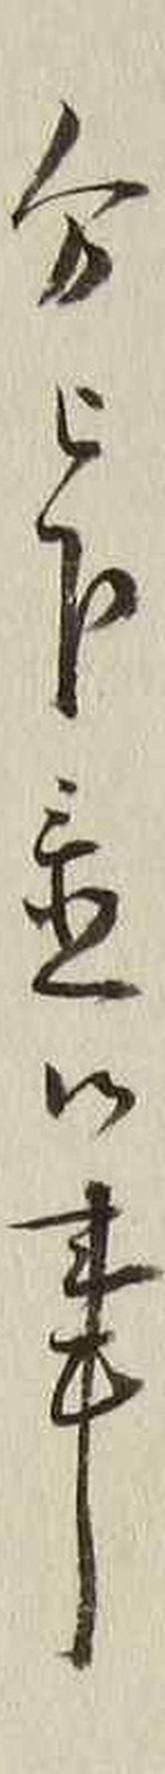分被下置候事
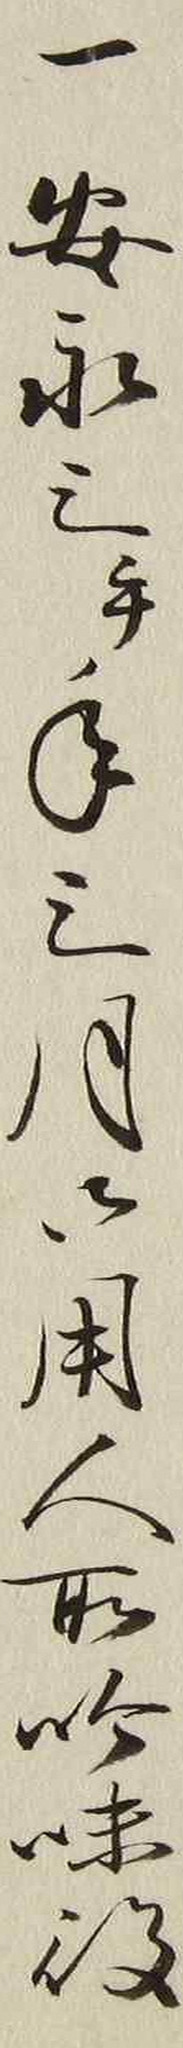一安永三午年三月御用人所吟味役
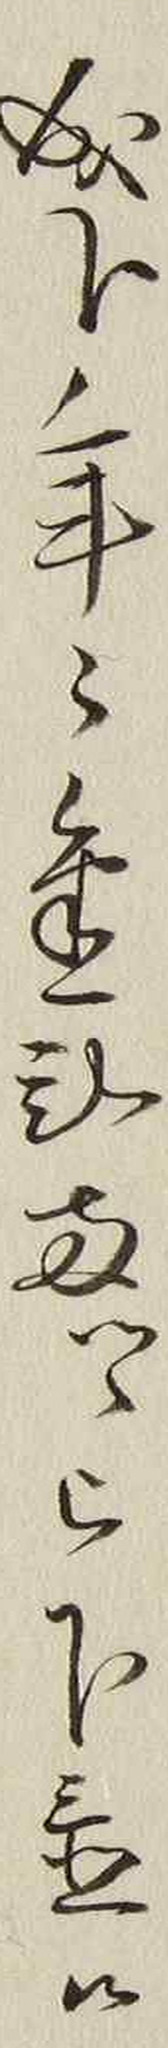成下年々金弐両ツヽ被下置候
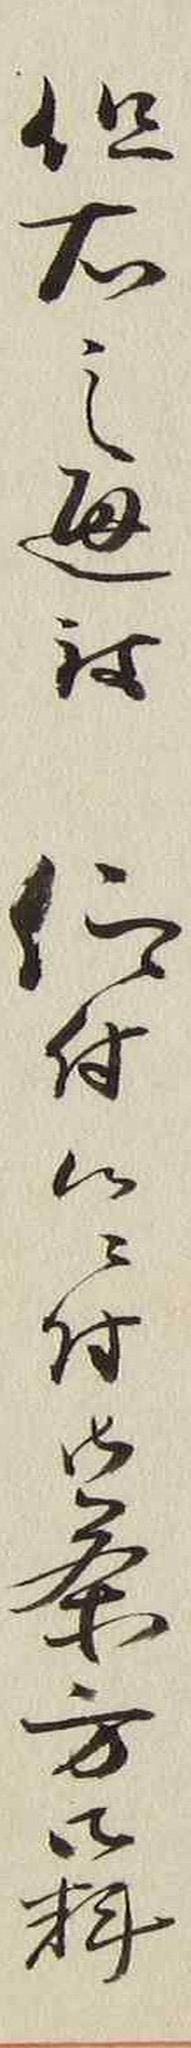但右之通被仰付候ニ付御茶方御料
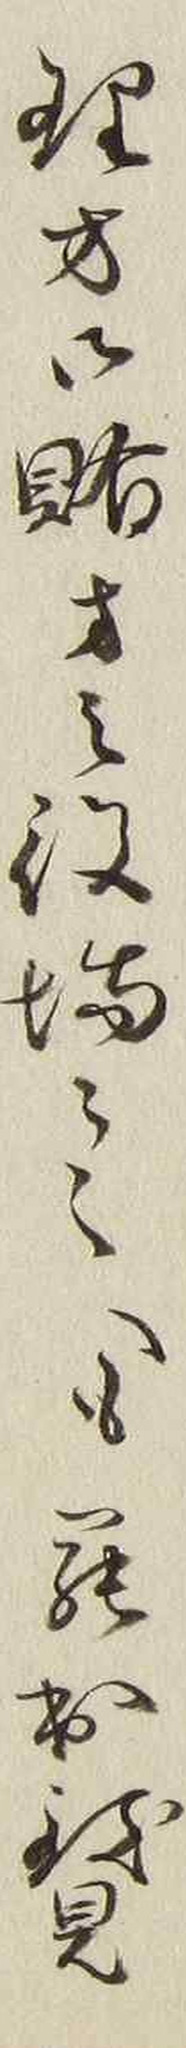理方御賄方之役場々々ㇸも罷出致見
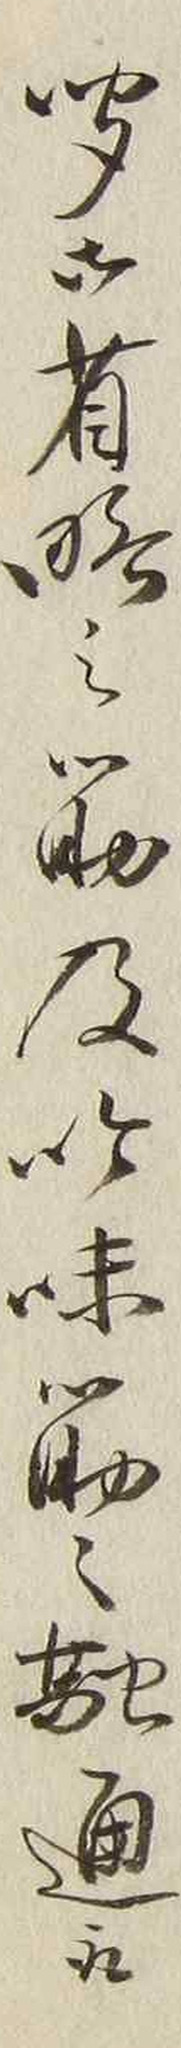聞御省略之筋及吟味筋之融通取

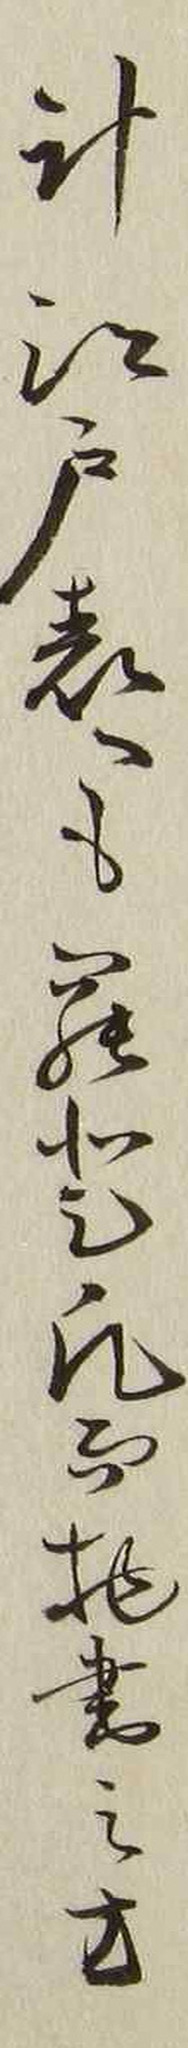計江戸表ㇸも罷登凡而物書之方
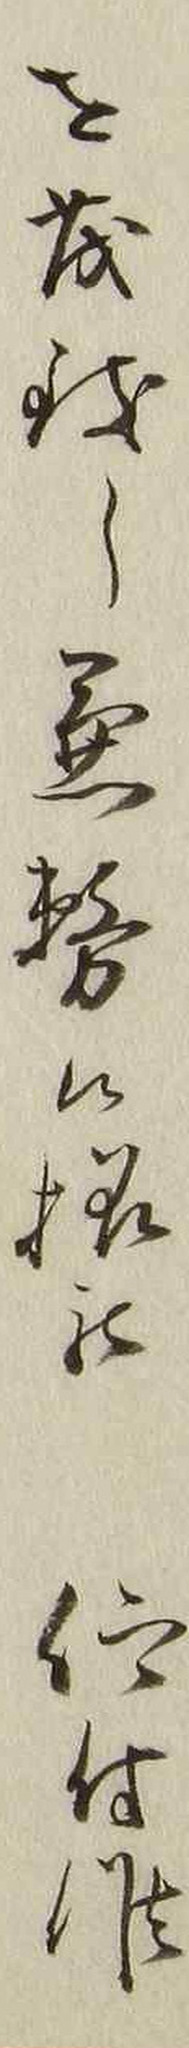をも致し兼務候様被仰付候
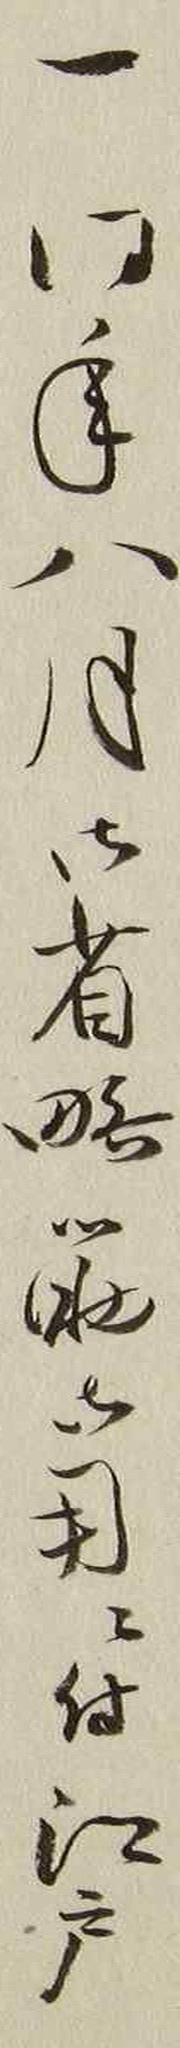一同年八月御省略筋御用ニ付江戸
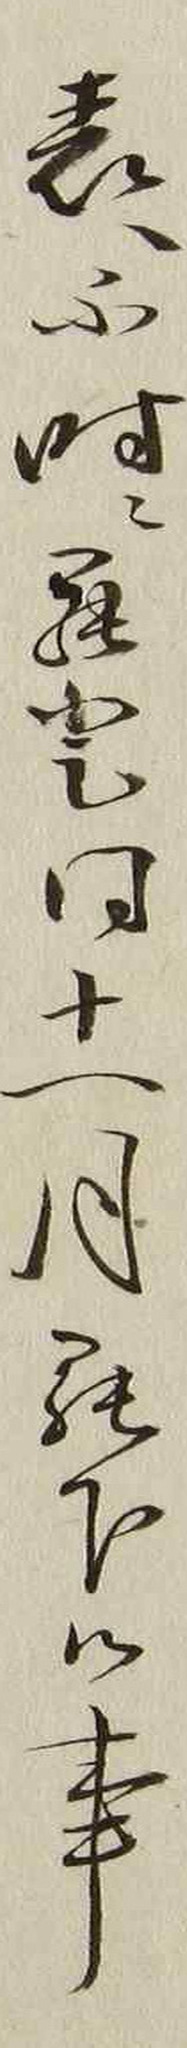表ㇸ不時ニ罷登同十一月罷下候事
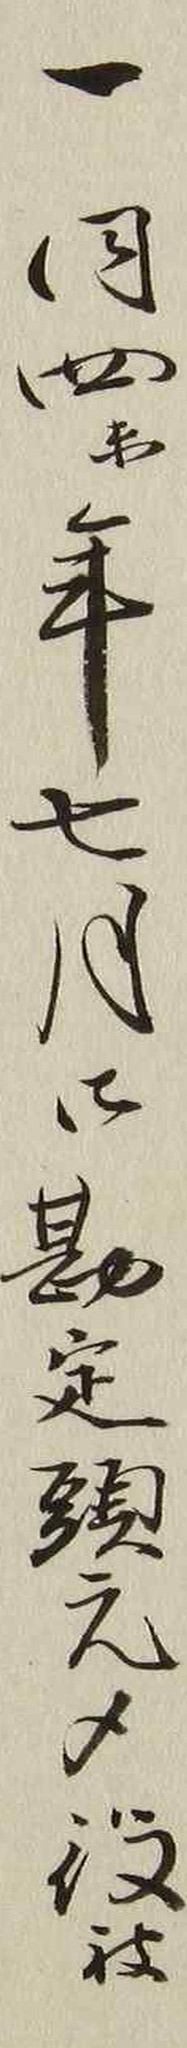一同四未年七月御勘定頭元〆役被
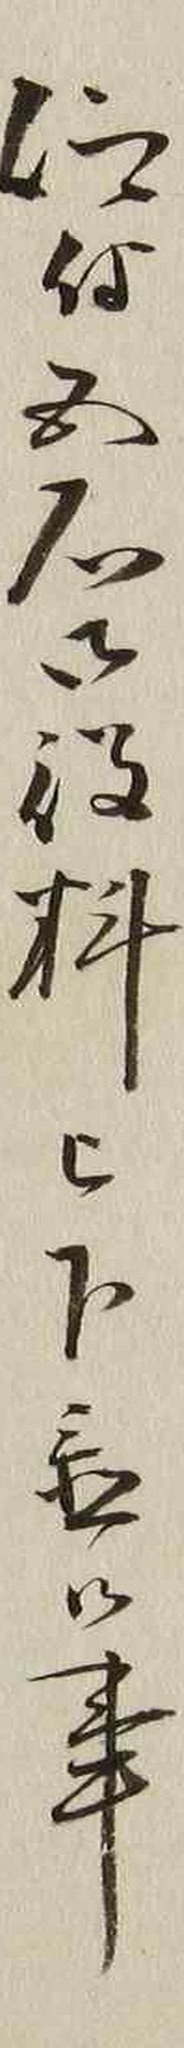仰付五石御役料被下置候事
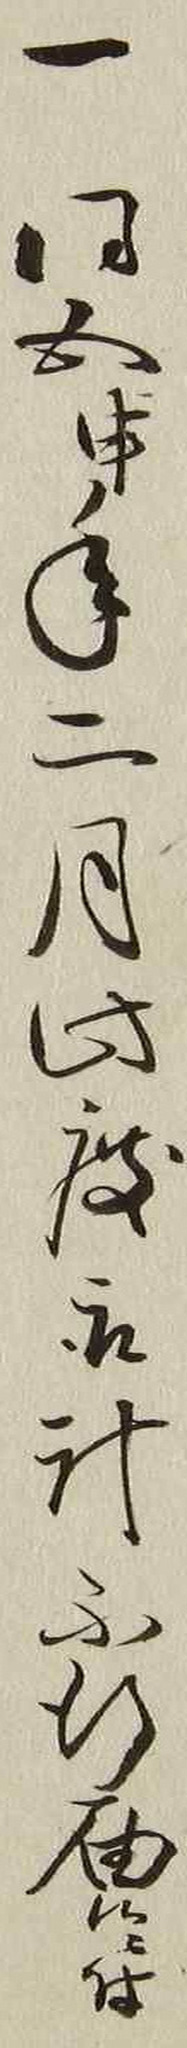一同五申年二月此度取計不行届候ニ付
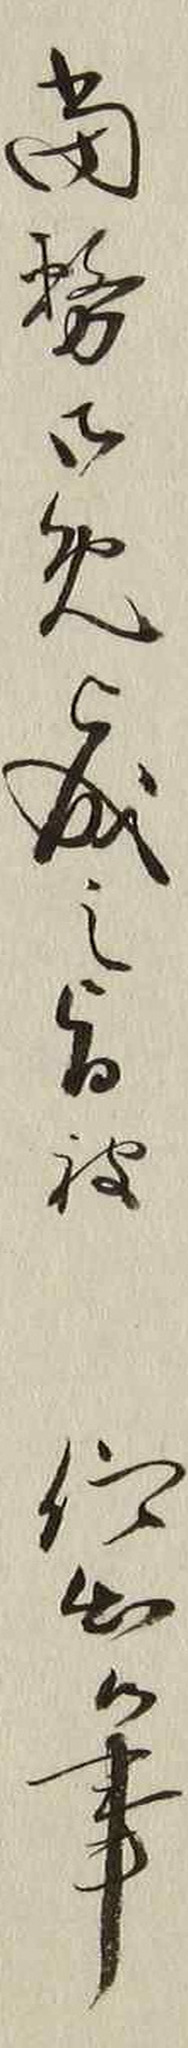当務御免被成之旨被仰出候事
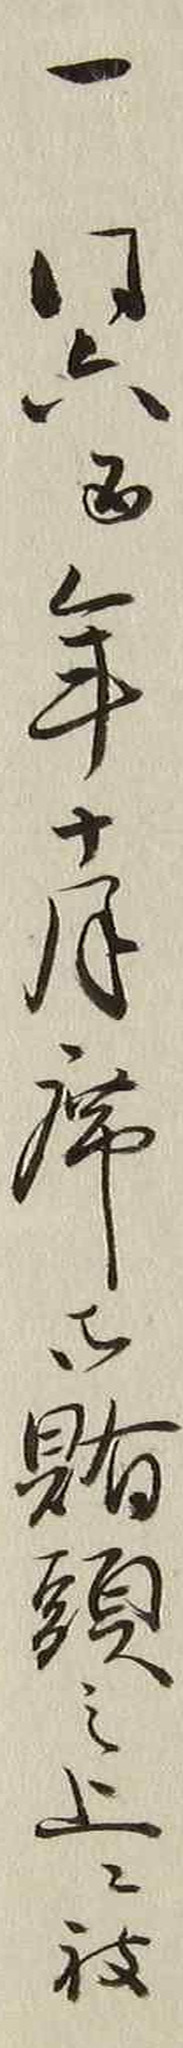一同六酉年十月席御賄頭之上ニ被
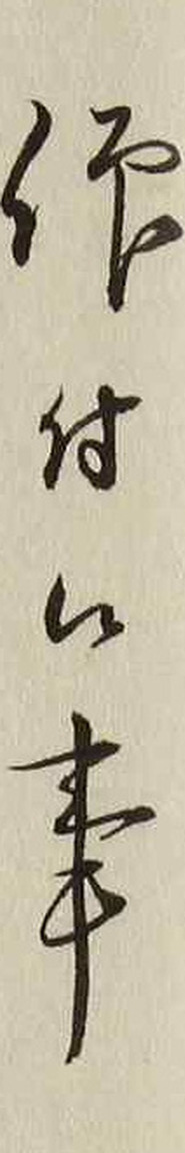仰付候事
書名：諸士系譜　巻之163　な之部5
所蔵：会津若松市立会津図書館
